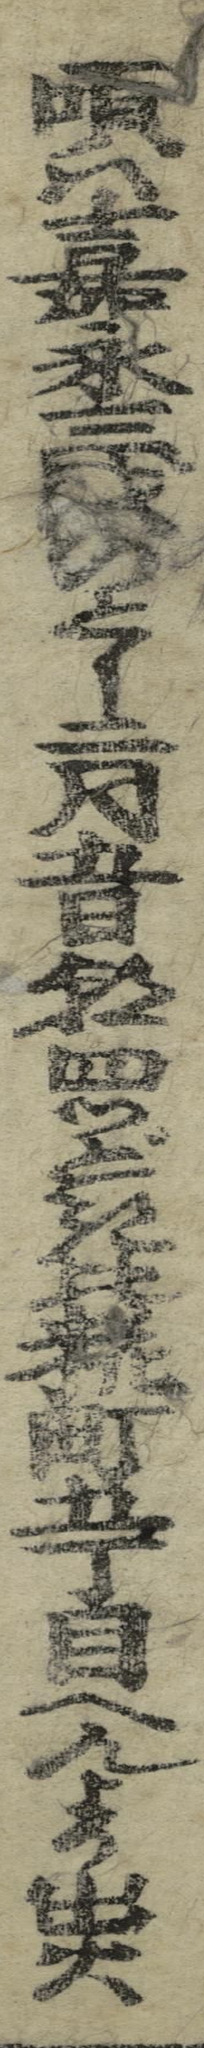頃は嘉永三戌のとし二月五日朝四ツとき比糀町五丁目へんより出火
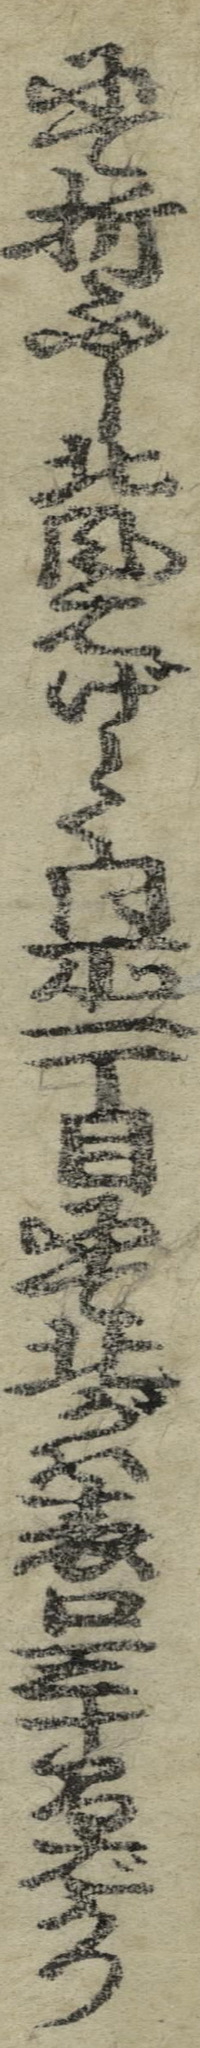にて折ふし北風はげしく同所一丁目にて北がは表口三十間ばかり
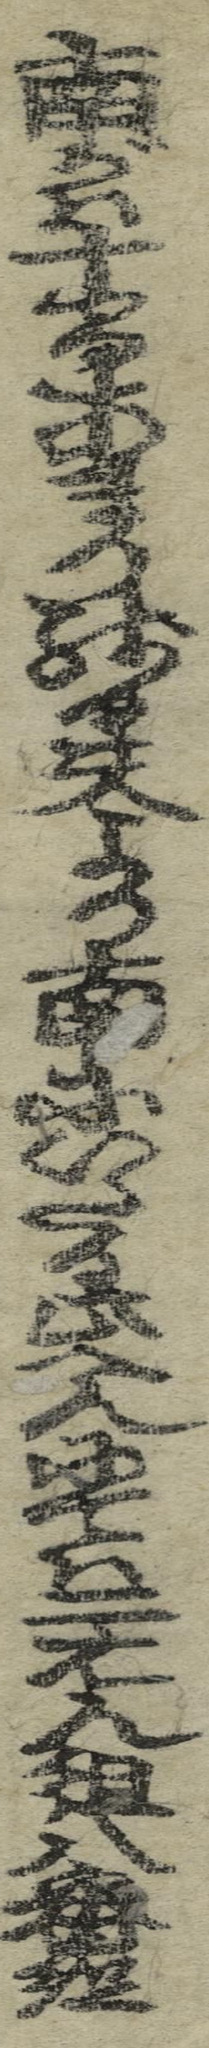南がは十間あまり残る夫より南にいたる此へんにては二はん組八番組
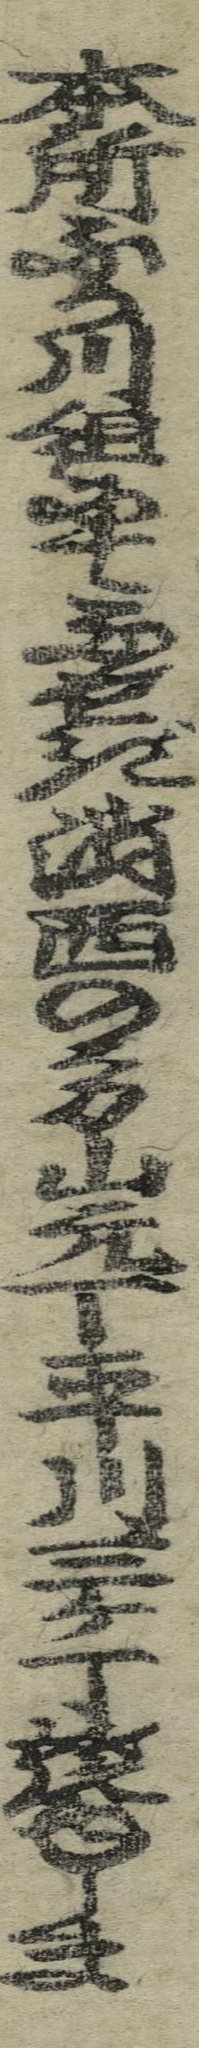本所ふか川組にてふせぎ消西の方山元丁平川三ケ丁焼ゆしま
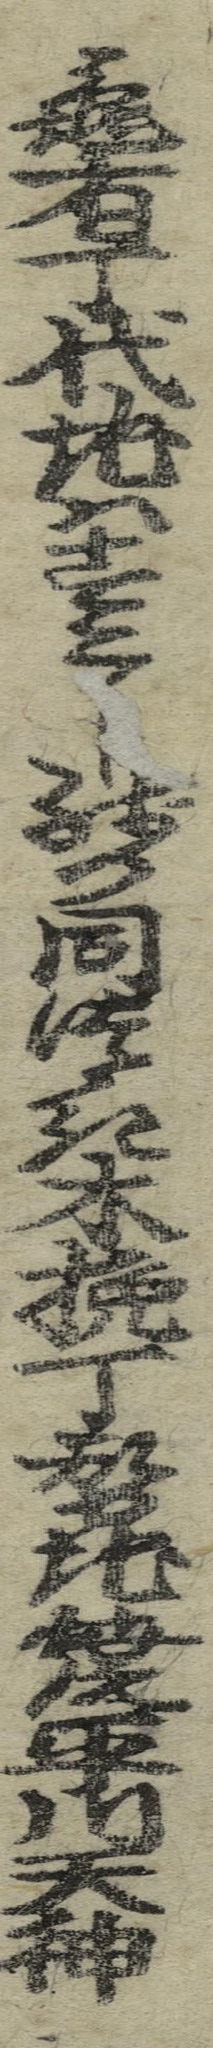亀有丁代地はすこし残り同つゝき木挽丁替地焼平川天神
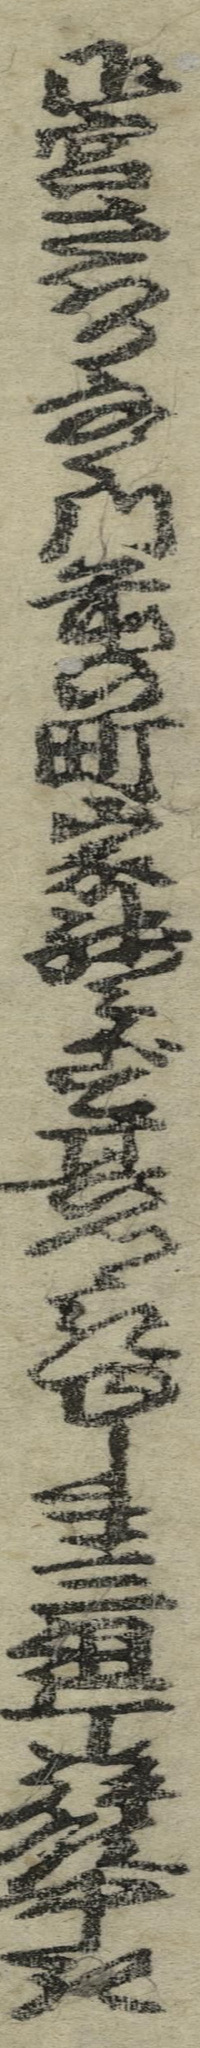御宮さはりなく門前の町家残らず其つゝきゆしま三組丁拝領やしき
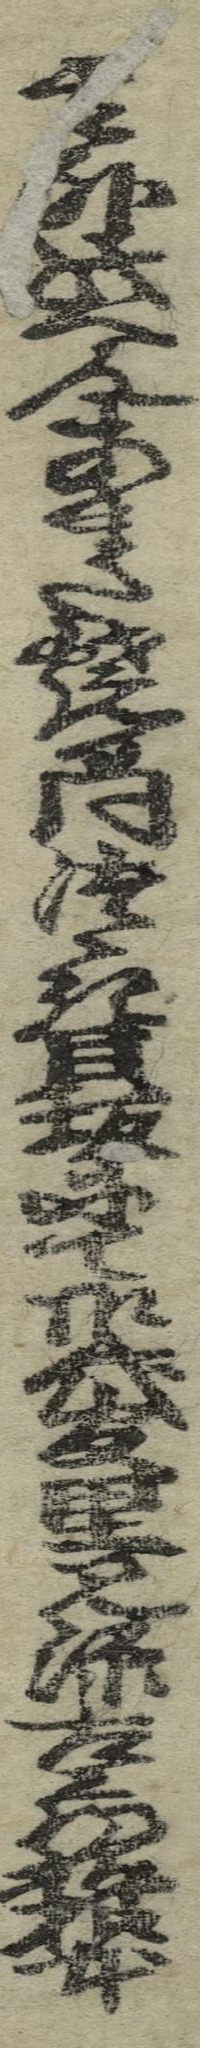其外此へんあまた焼る同つつき貝坂にて御代官里見源左衛門様旗本
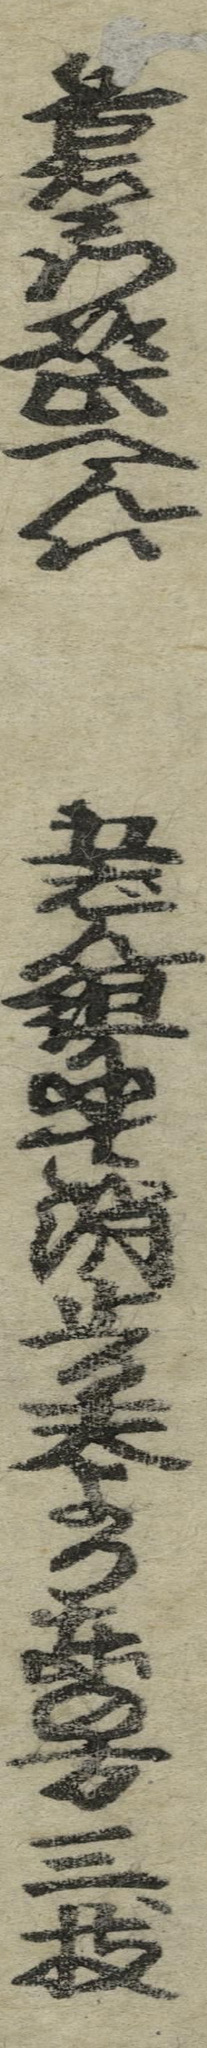兵右衛門様此へんは五ばん組にて消止る夫れより東の方三枝
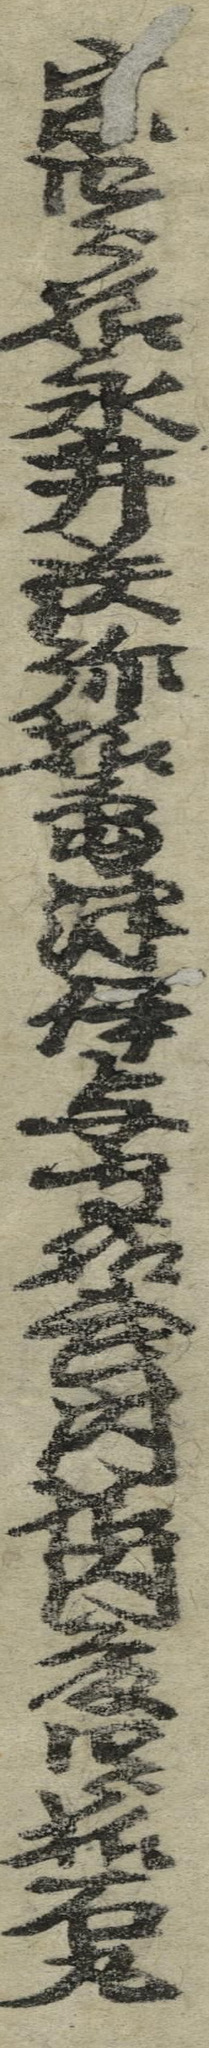宗四郎様永井鉄弥様魚津伊与守様武内様内藤四郎様石丸
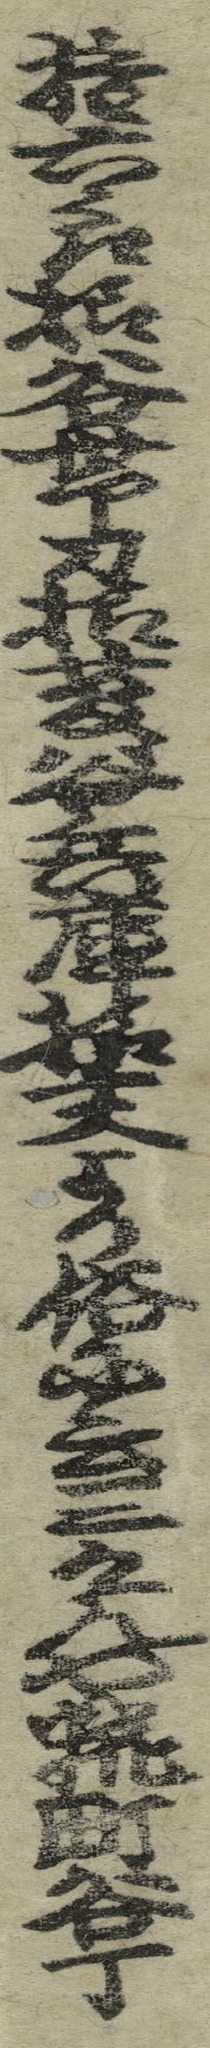権六郎様谷帯刀様藤谷兵庫様夫より俗に云三けんや糀町谷丁
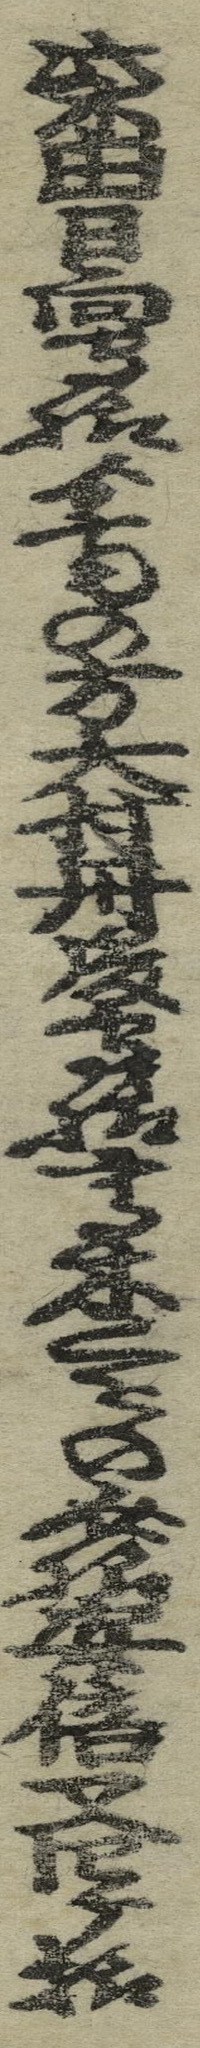柴田日向守様ゟ南の方大村丹後守様高木進の介様安倍又四郎様
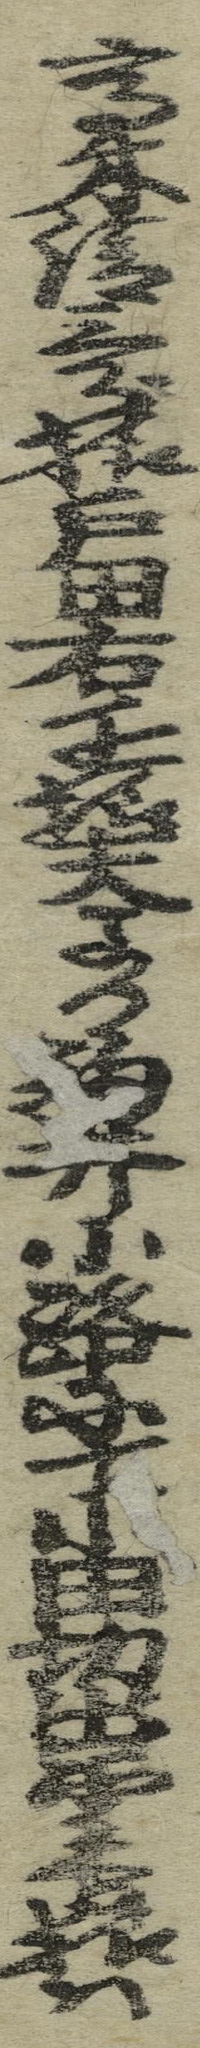高木信三郎様戸田右近様夫より駒井小路にて小田切出雲様は
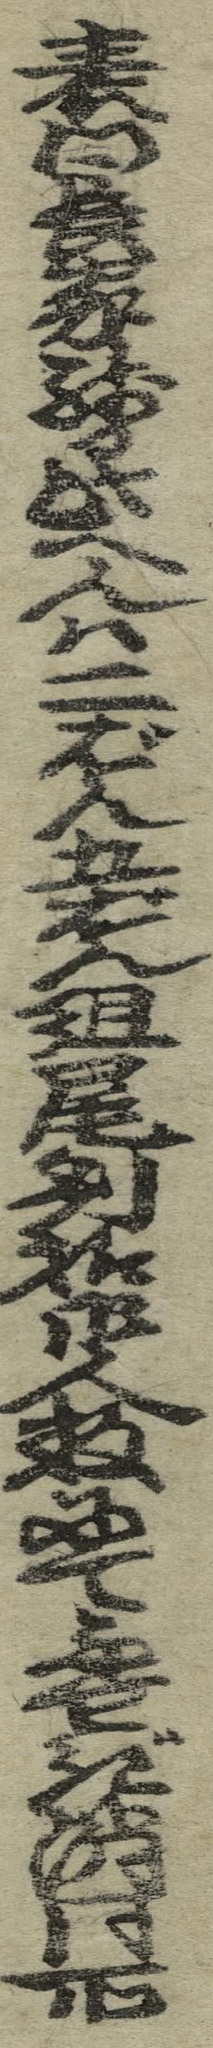表門長家残る此へんはニばん五ばん組尾州様御人数にてふせぎ消同所
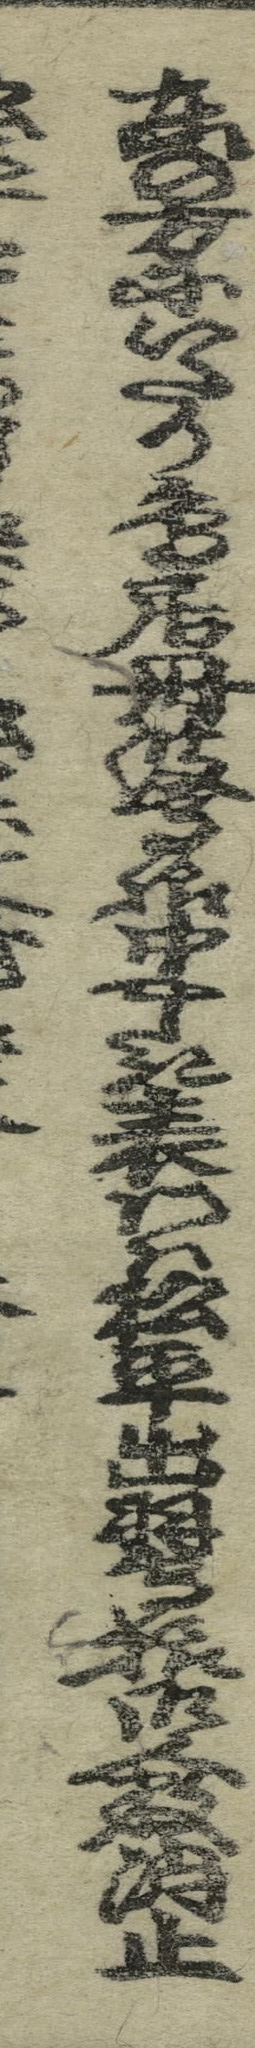東の方にいたり鳥居丹波守様中やしき表門は松平出羽守様御人数消止
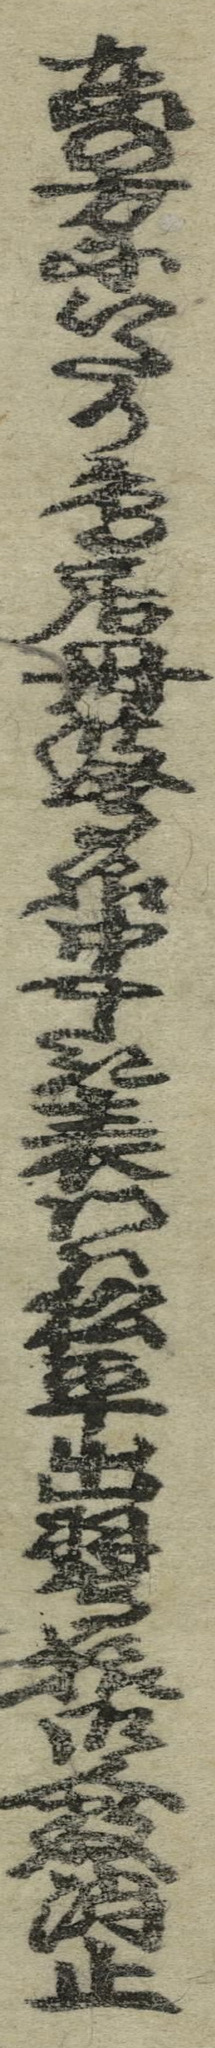東の方にいたり鳥居丹波守様中やしき表門は松平出羽守様御人数消止
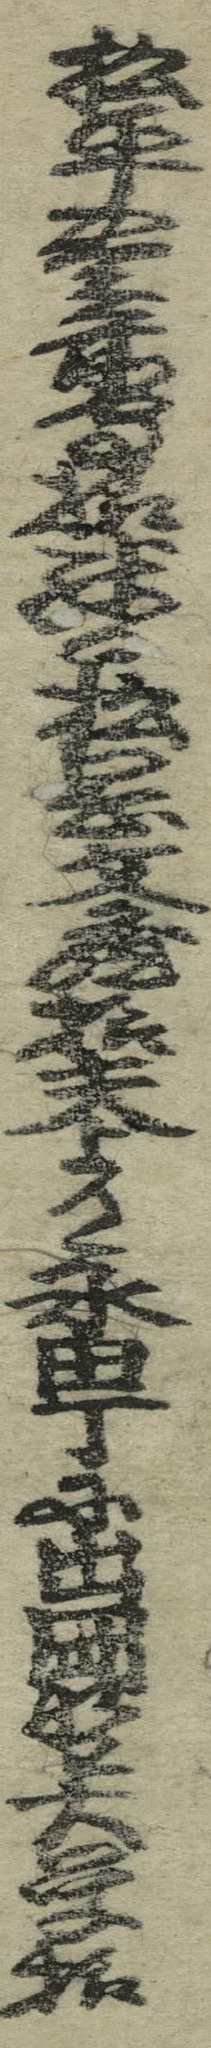松平豊前守様残る松岡文蔵様夫より永田丁に出岡野大学様
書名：[嘉永三年二月の江戸大火に関する瓦版]
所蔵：東京大学地震研究所図書室 Earthquake Research Institute Library, The University of Tokyo, JAPAN
